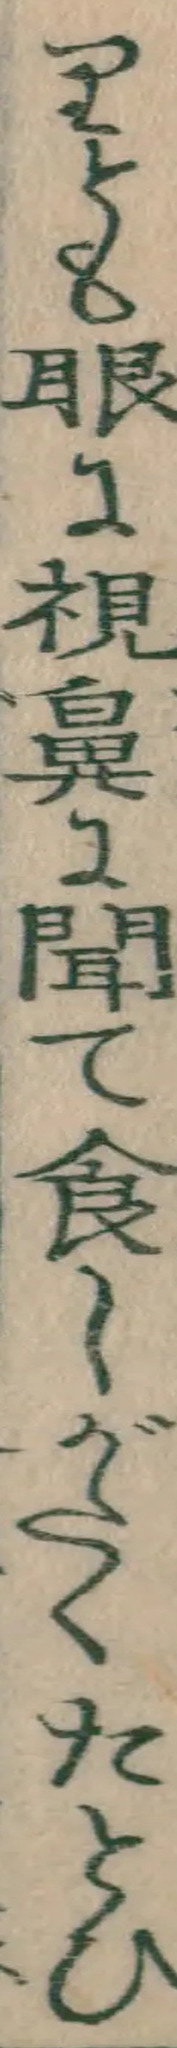りとも眼に視鼻に聞て食しがたくたとひ
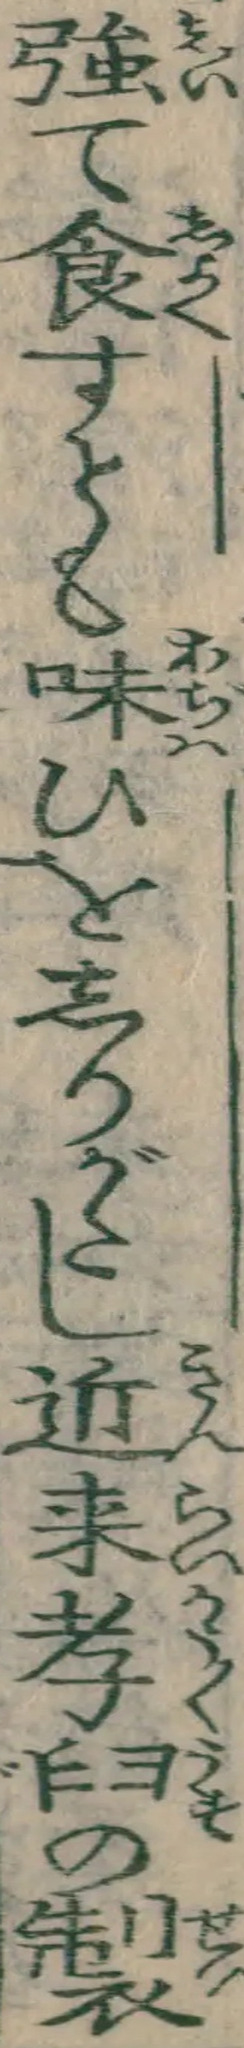強て食すとも味ひをしりがたし近来孝臼の製
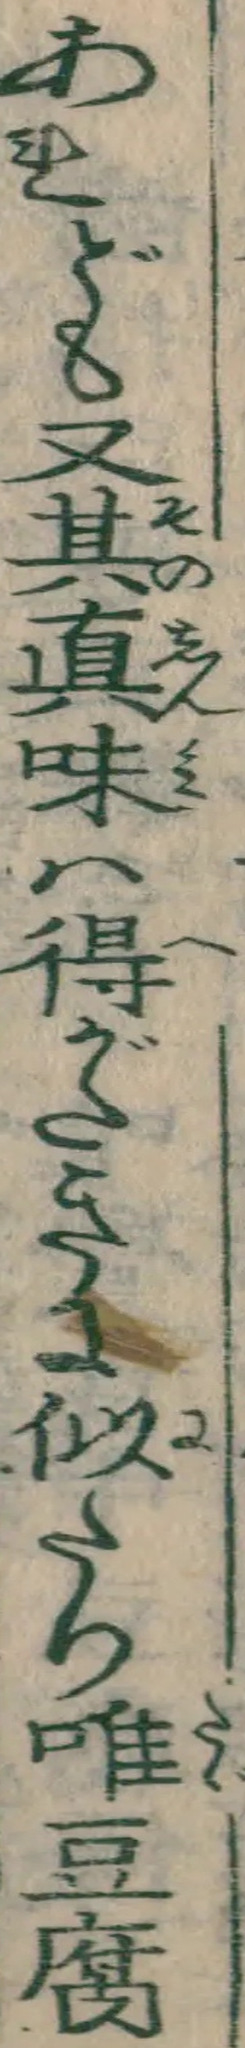あれども又其真味は得がたきに似たり唯豆腐
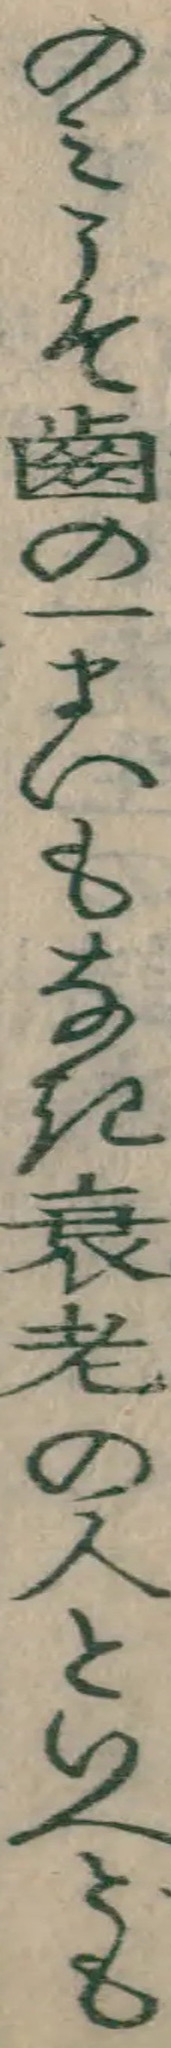のみこそ歯の一まいもなき衰老の人といへども
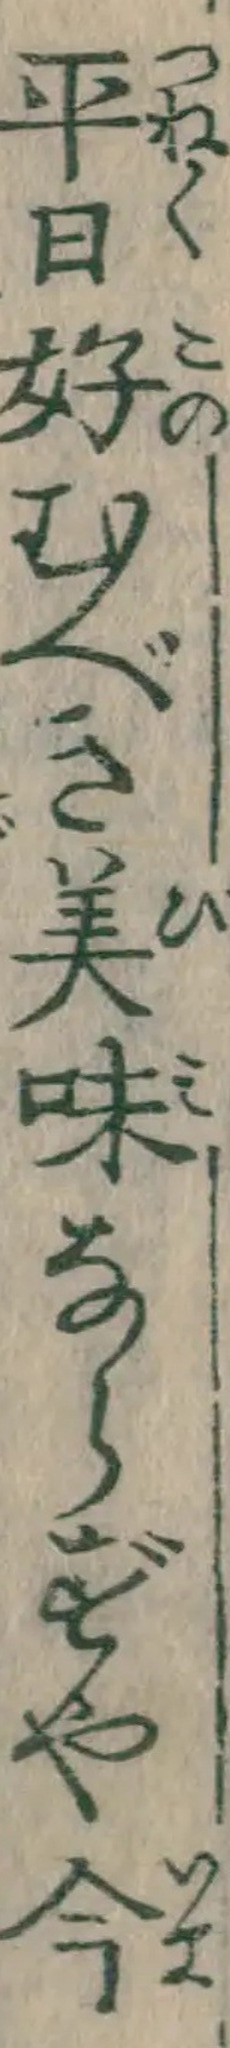平日好むべき美味ならずや今
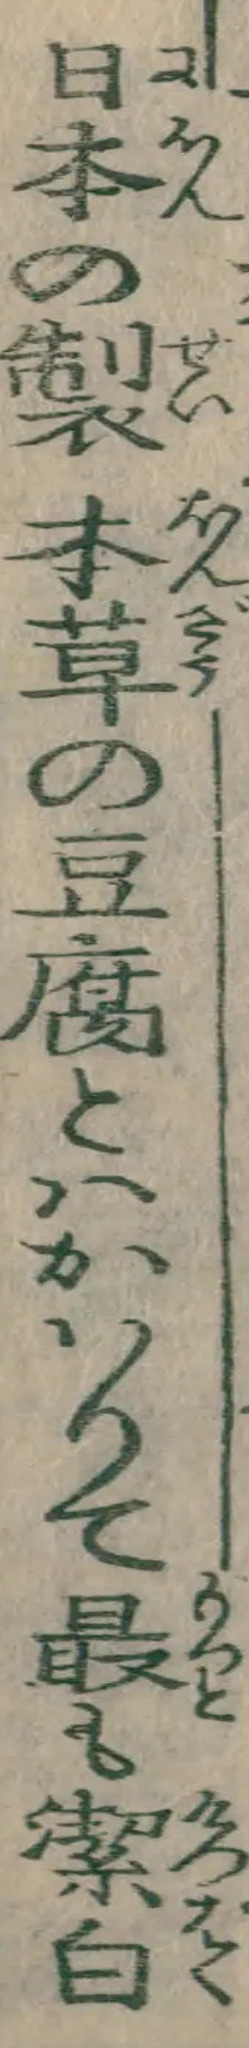日本の製本草の豆腐とはかはりて最も潔白

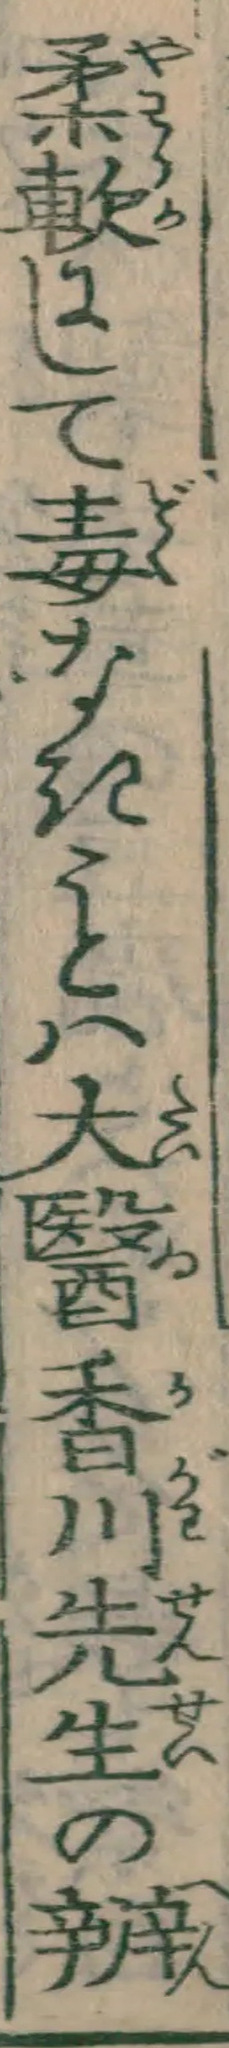柔軟にして毒なきことは大医香川先生の弁
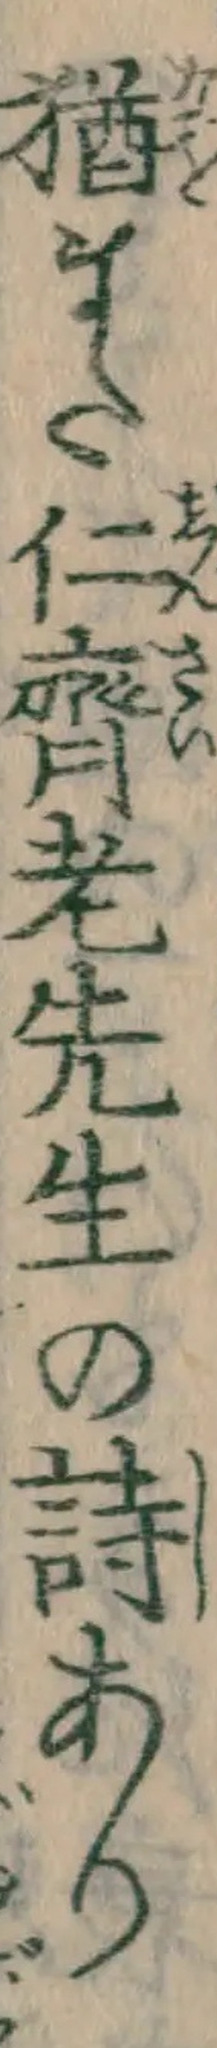猶また仁斎老先生の詩あり
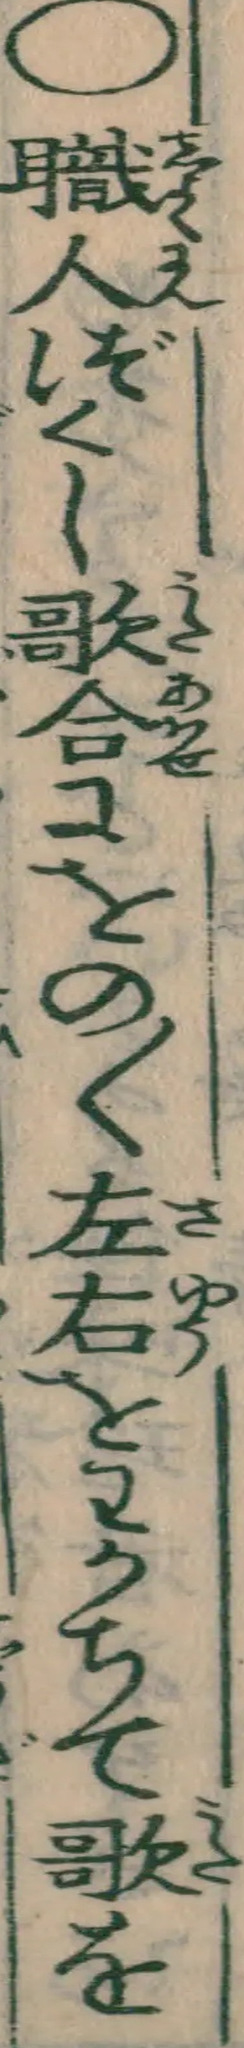○職人づくし歌合にをの〳〵左右をわかちて歌を
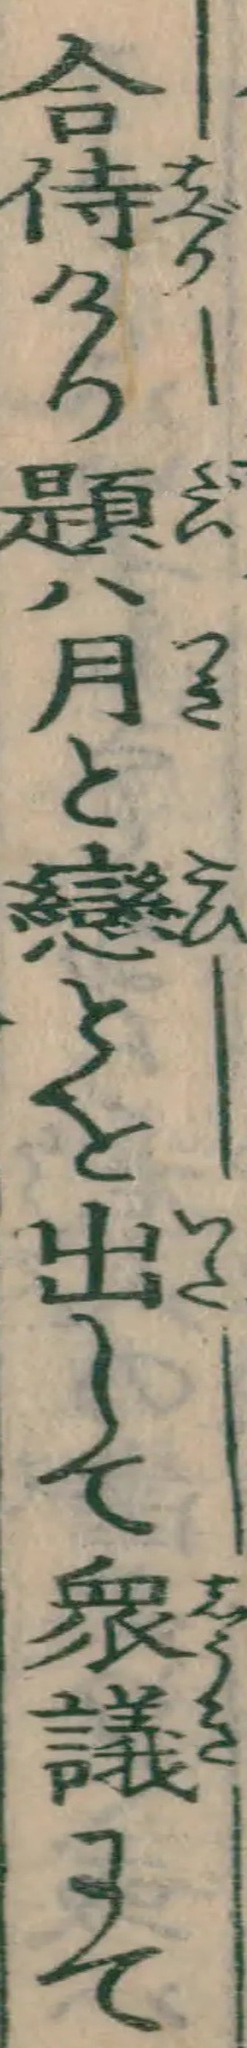合侍けり題は月と恋とを出して衆議にて
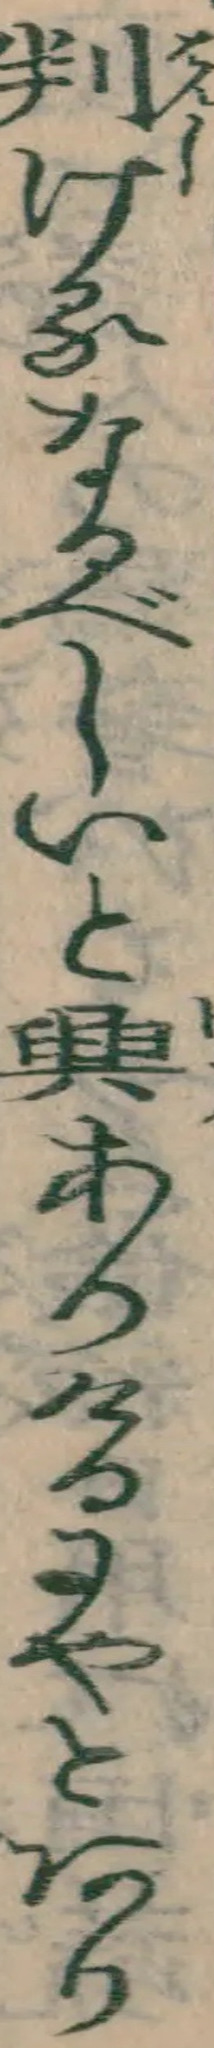判けるなるべしいと興ありけるにやとあり
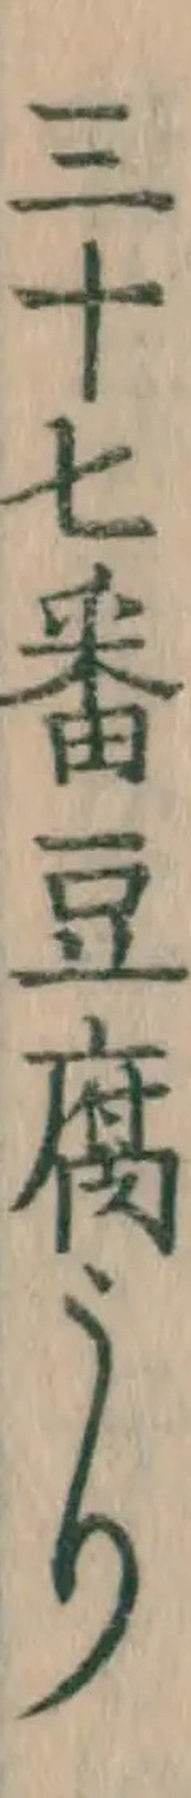三十七番豆腐うり
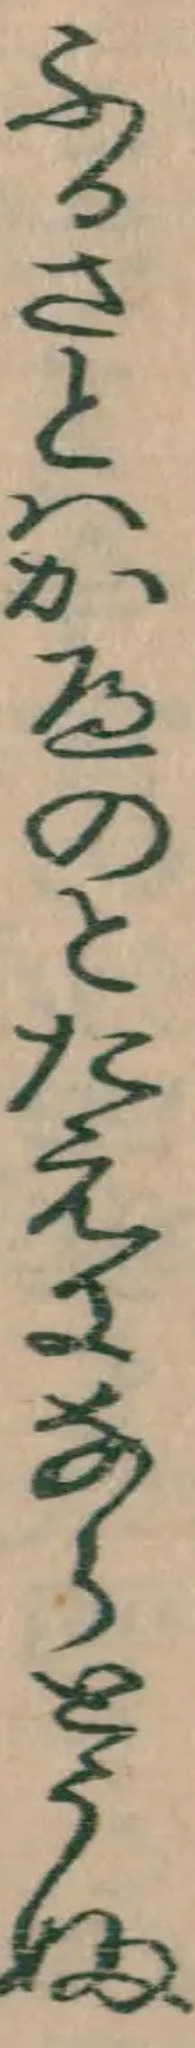ふるさとはかへのとたえにならとうふ
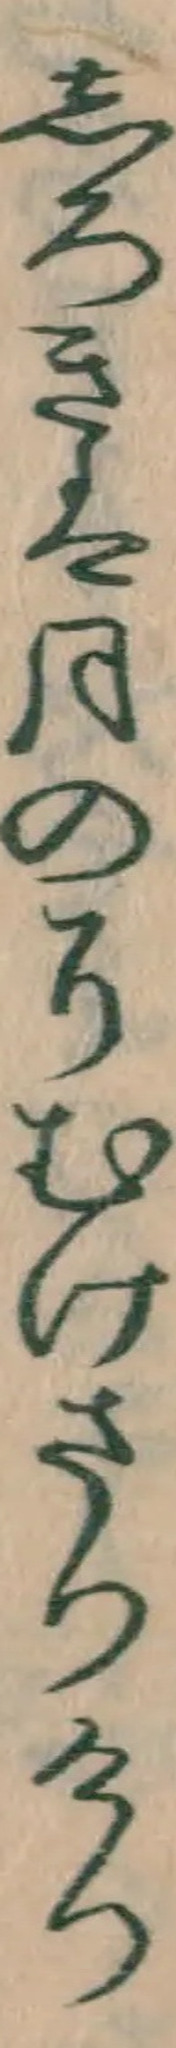しろきは月のそむけさりけり
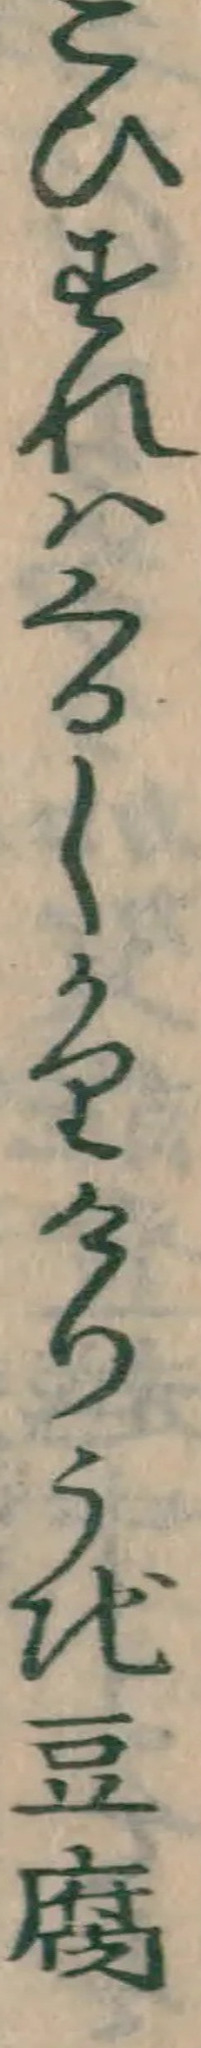こひすれはくるしかりけりうぢ豆腐
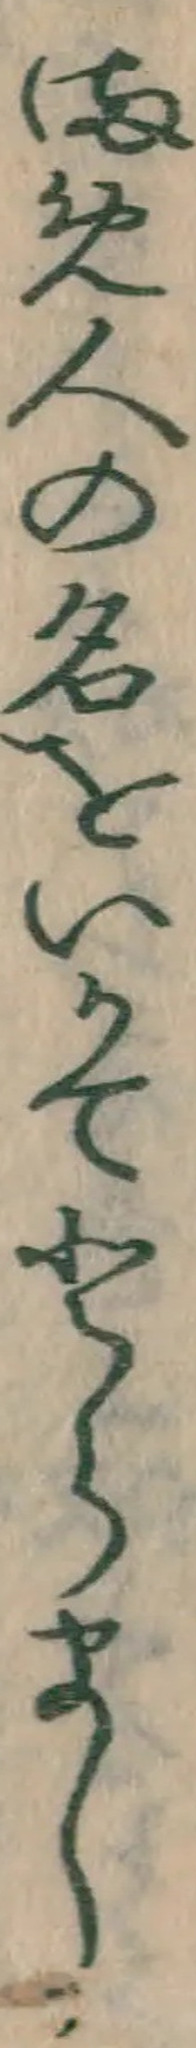まめ人の名をいかてとうまし
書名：豆腐百珍. 続編
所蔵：国立国会図書館 National Diet Library, JAPAN
